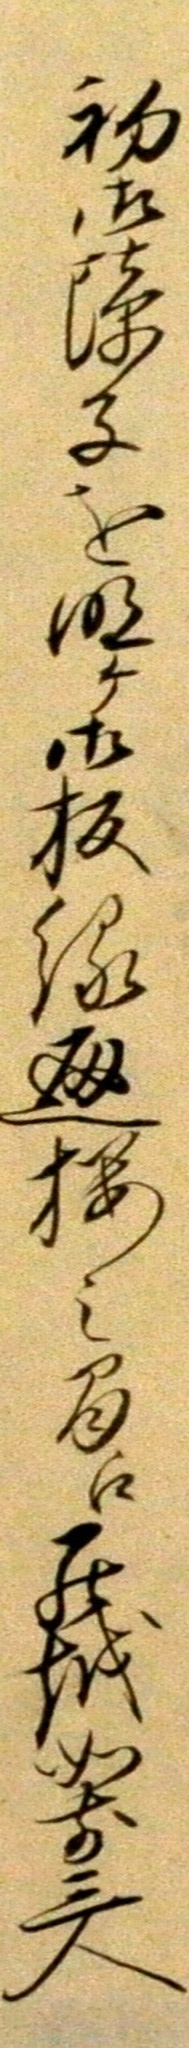初御障子を明ケ御板縁通桜之間え罷越如前三人
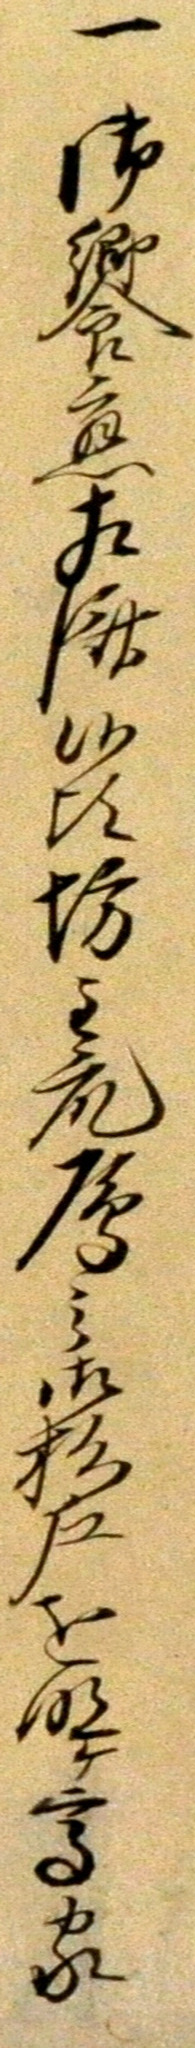一御饗應相済候頃坊主衆鳫之御杉戸を明ケ高家
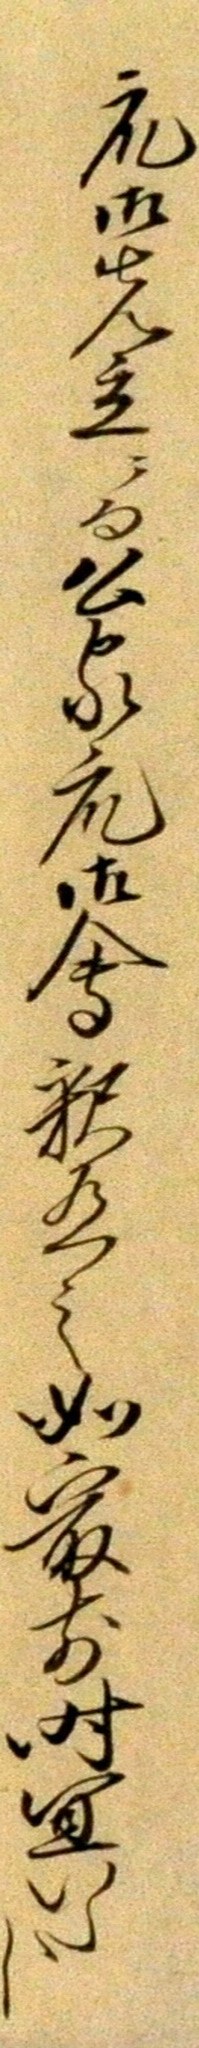衆御先立ニ而公家衆會釈有之如最前時宜いたし
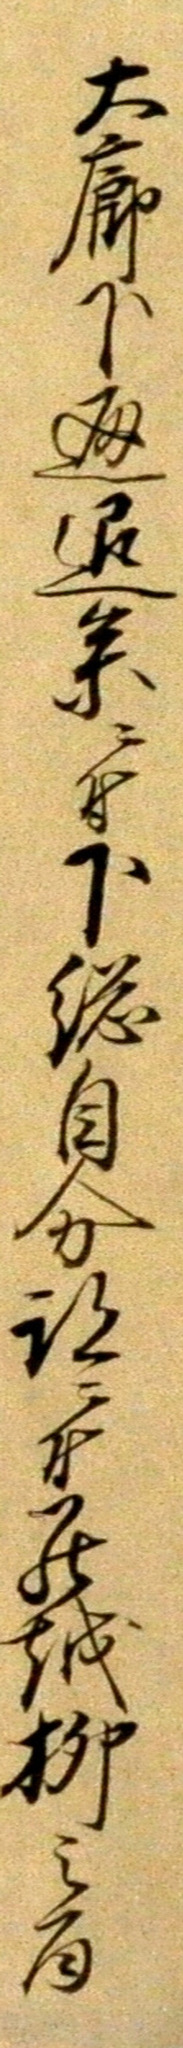大廊下通退参ニ付下総自分跡ニ付罷越栁之間
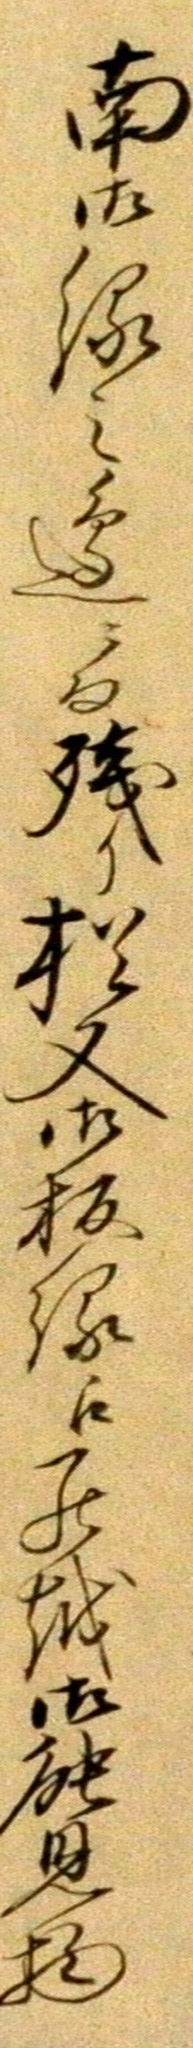南御縁之邊ニ而残り猶又御板縁え罷越御能見物
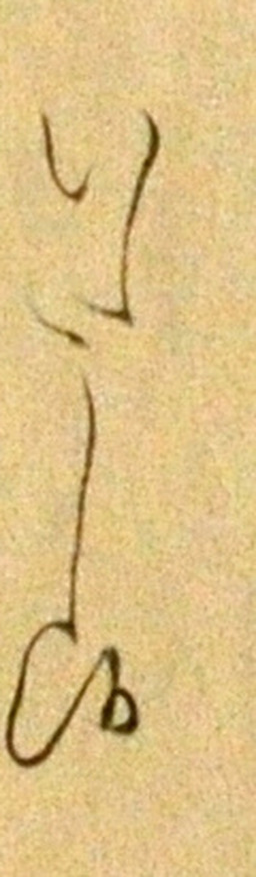いたし候
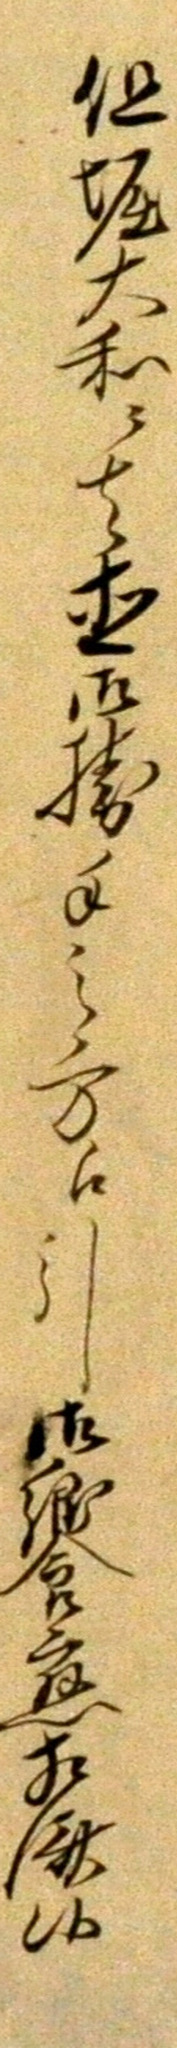但堀大和には直御勝手之方え引御饗應相済候
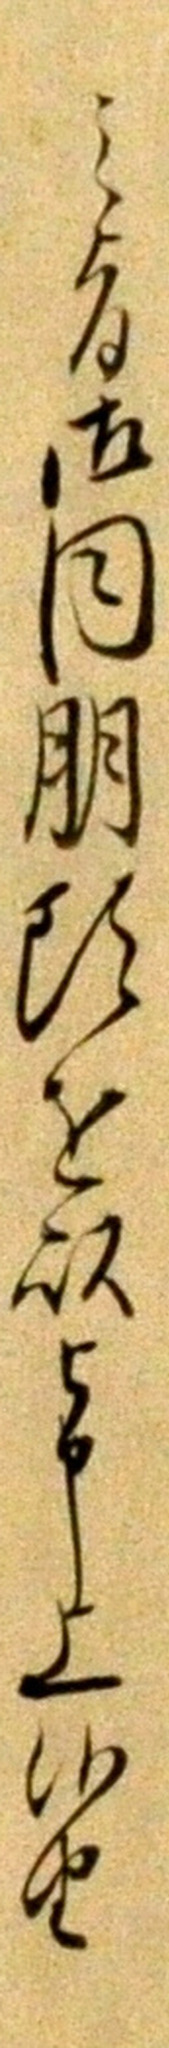之間御同朋頭を以被申上候由

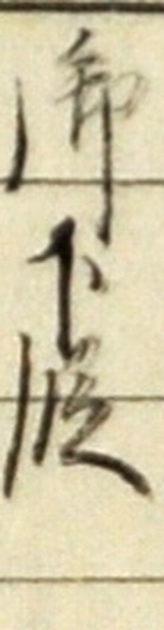御下段

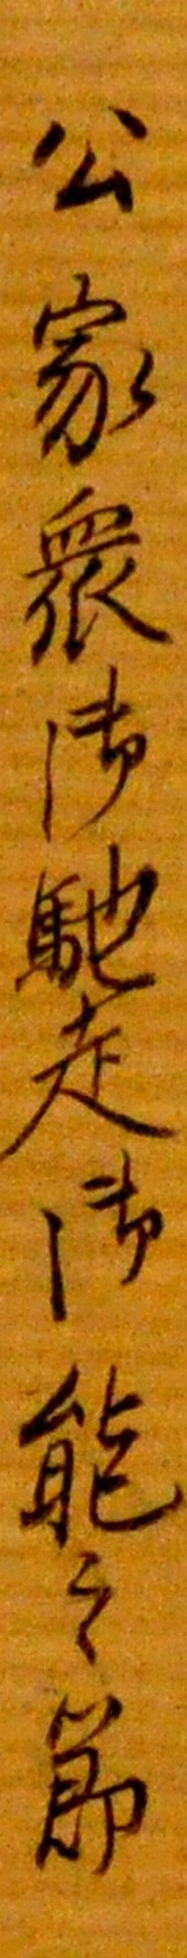公家衆御馳走御能之節
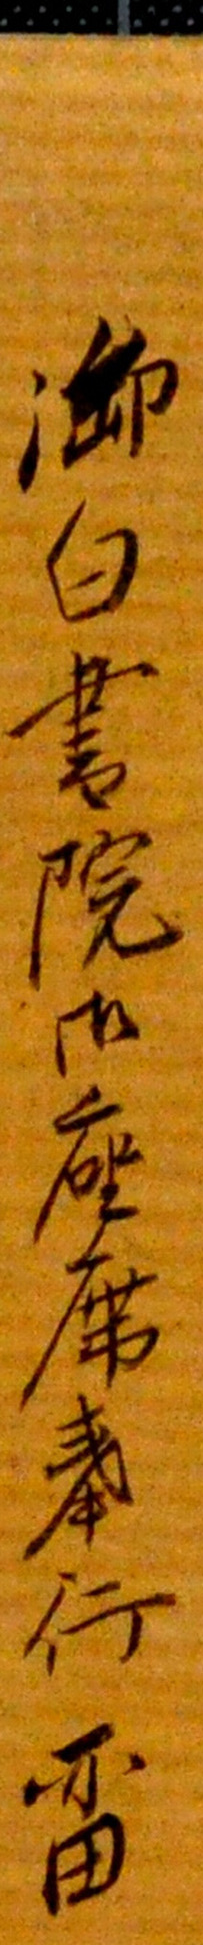御白書院御座席奉行留

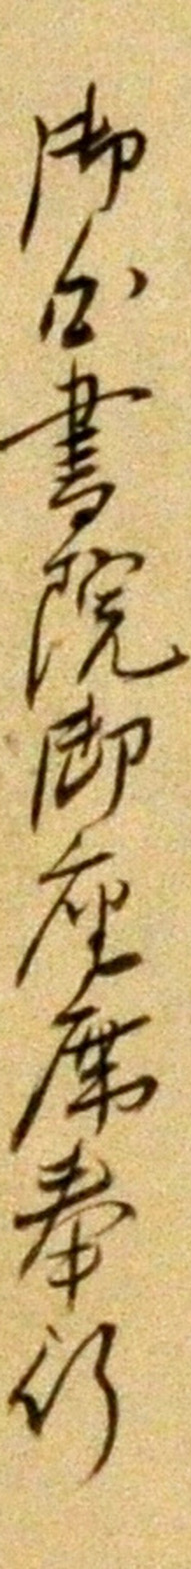御白書院御座席奉行
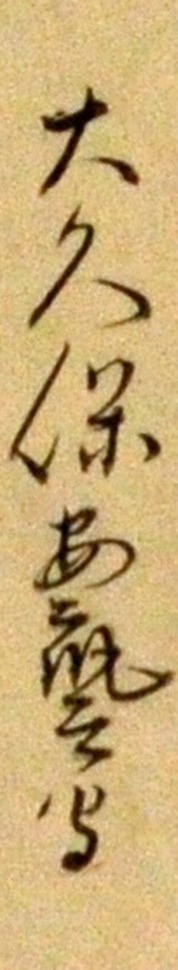大久保安藝守
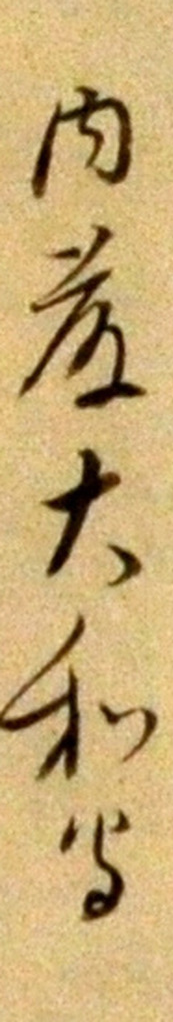内藤大和守
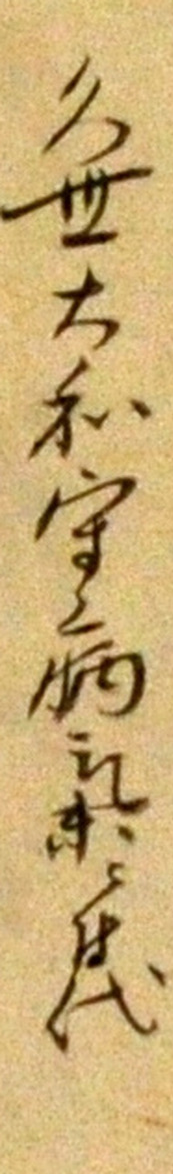久世大和守病気ニ付代
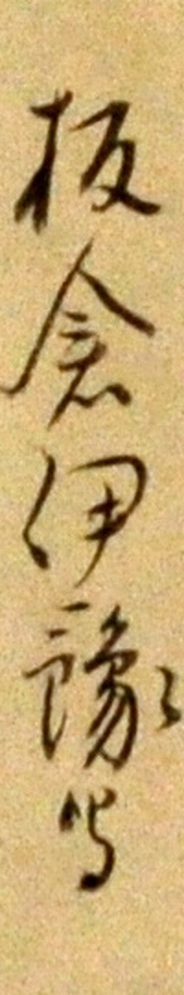板倉伊豫守
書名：御白書院御座席奉行勤方留外
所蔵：伊那市立高遠町図書館・合同会社AMANE
